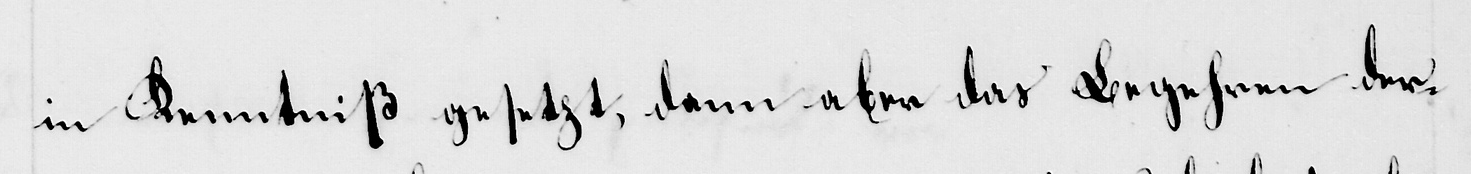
in Kenntniß gesetzt, dann aber das Begehren der¬
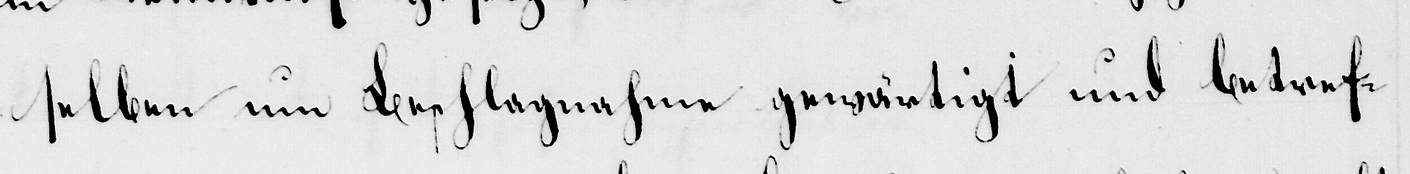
selben um Beschlagnahme gewärtigt und betref¬
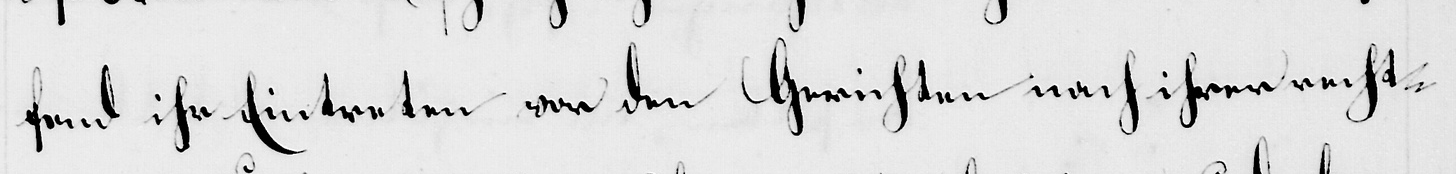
fend ihr Eintreten vor den Gerichten nach ihrer recht¬
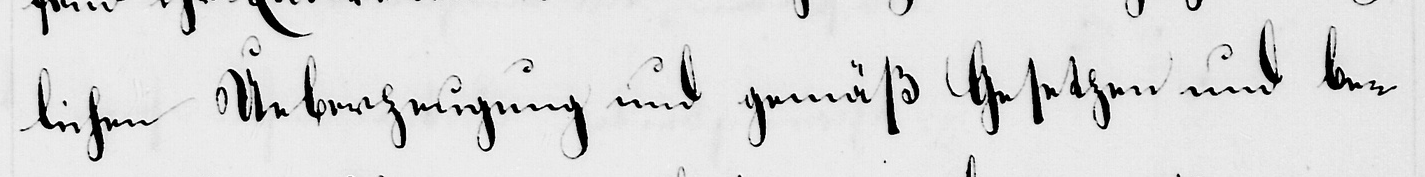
lichen Ueberzeugung und gemäß Gesetzen und be¬
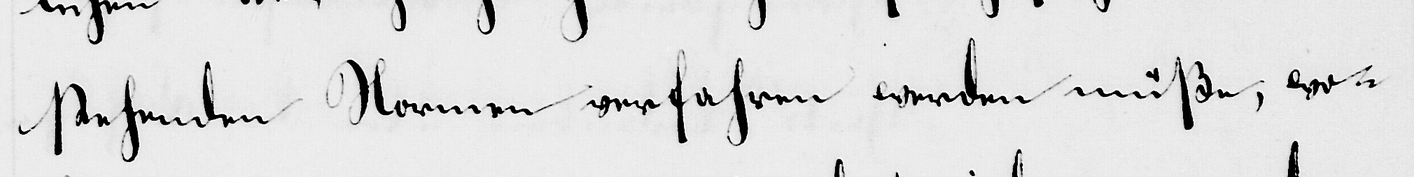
stehenden Normen verfahren werden müße, wo¬
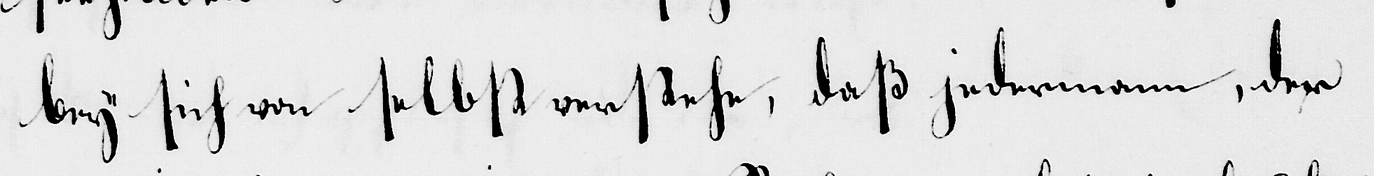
bey sich von selbst verstehe, daß jedermann, der
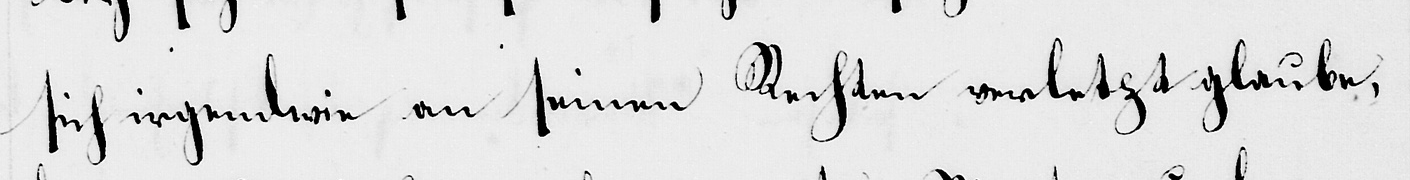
sich irgendwie an seinen Rechten verletzt glaube,
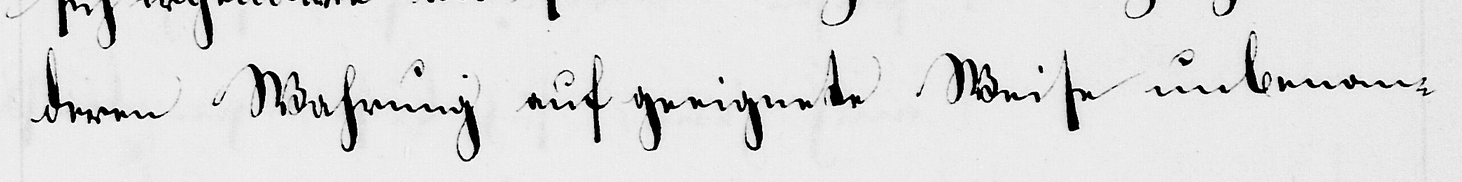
deren Wahrung auf geeignete Weise umbenom¬
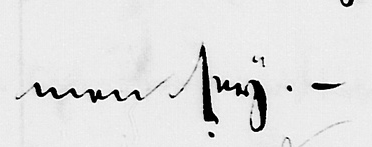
men sey. –
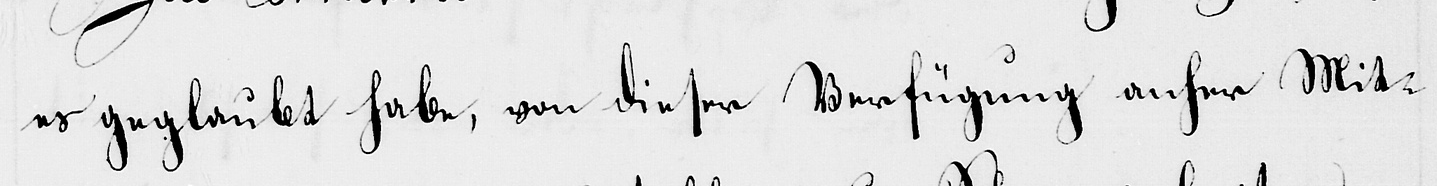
es geglaubt habe, von dieser Verfügung anher Mit¬
